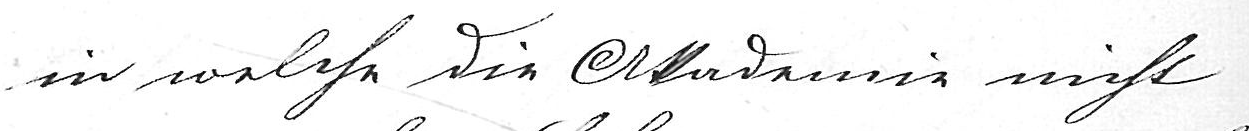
in welche die Akademie nicht
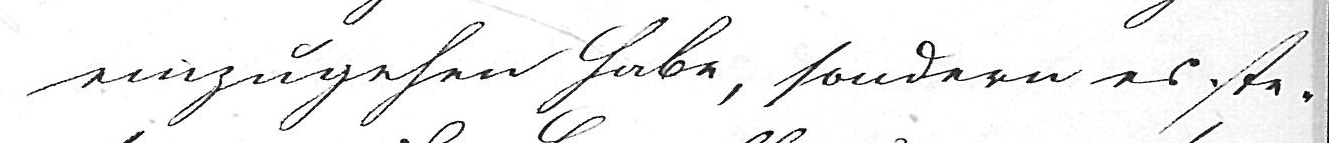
einzugehen habe, sondern es ste-
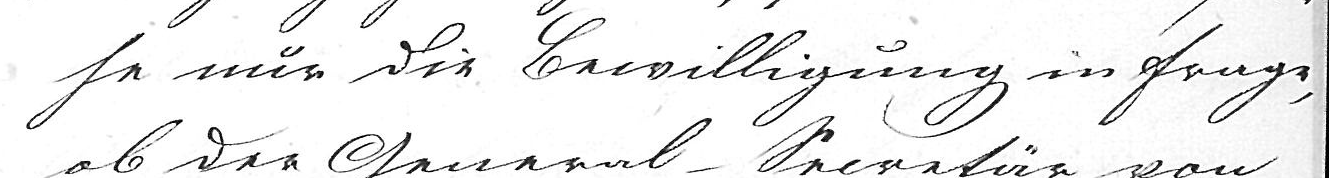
he nur die Bewilligung in Frage,
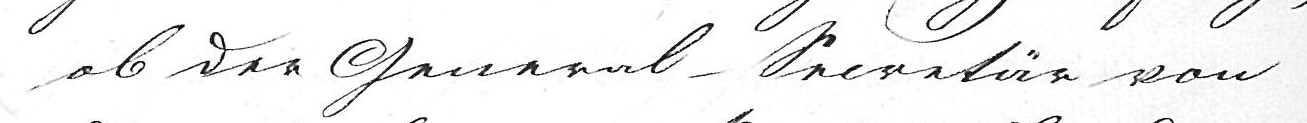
ob der General-Secretär von
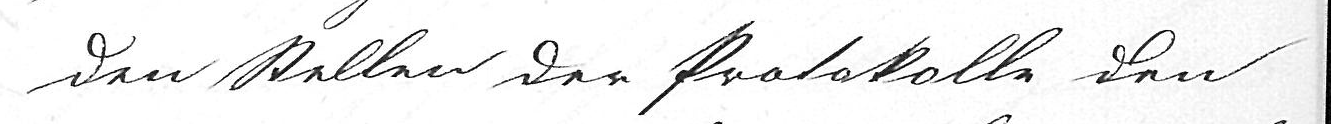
den Stellen der Protokolle den
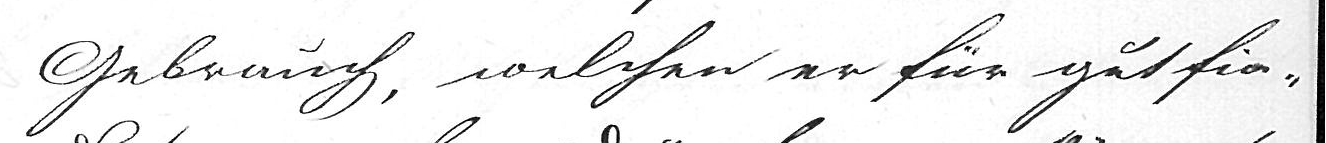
Gebrauch, welchen er für gut fin-
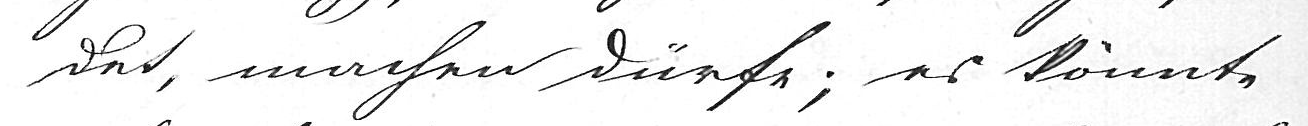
det, machen dürfe; Es könnte
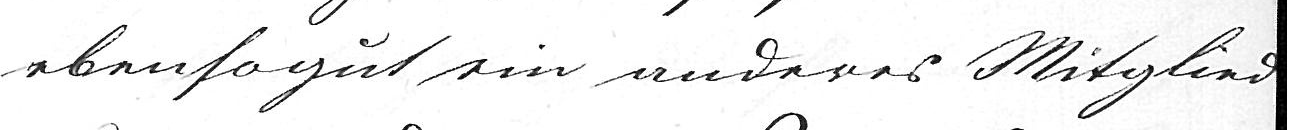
ebensogut ein anderes Mitglied
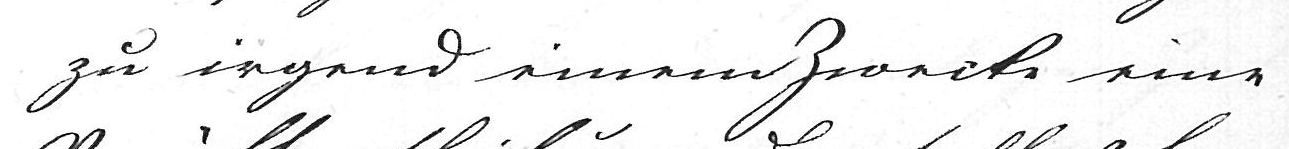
zu irgend einem Zwecke eine
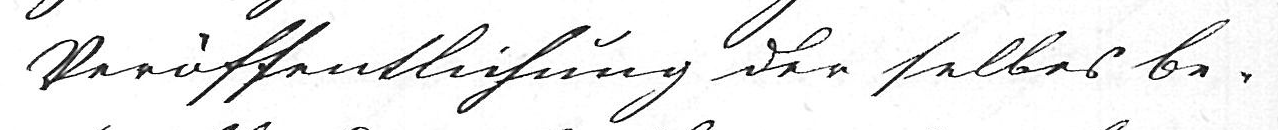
Veröffentlichung der selbes be-
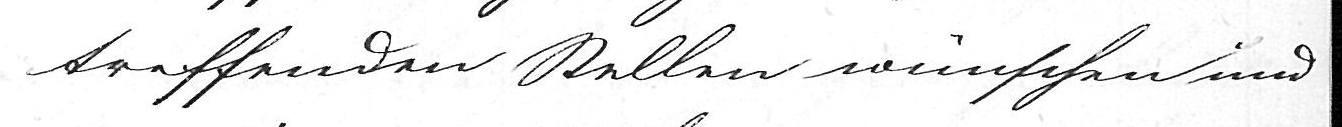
treffenden Stellen wünschen und
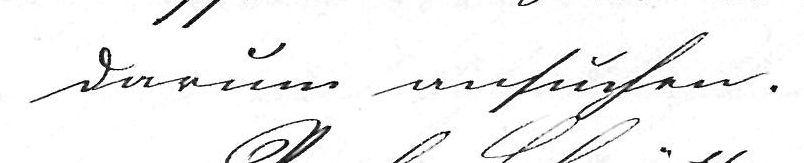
darum ansuchen.
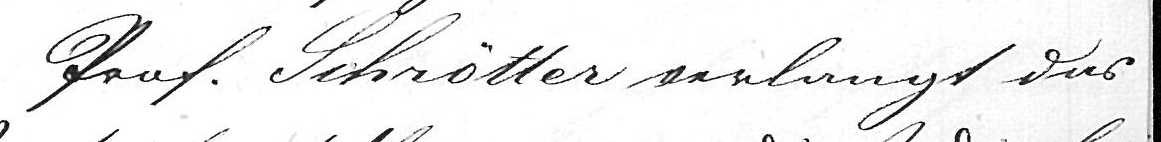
Prof. Schrötter verlangt das
